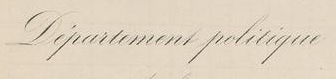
Département politique
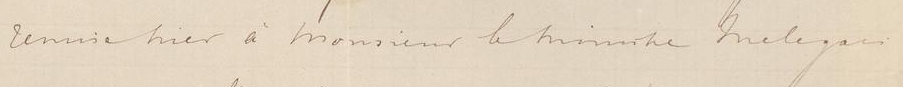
remise hier à Monsieur le Ministre Melegari
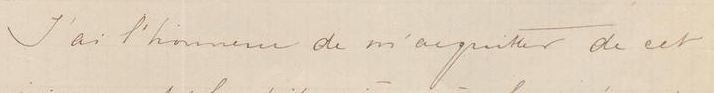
J'ai l'honneur de m'acquitter de cet
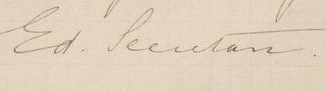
Ed. Secretan
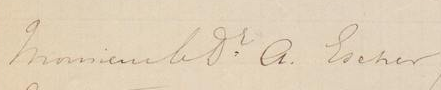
Monsieur le Dr A. Escher,
